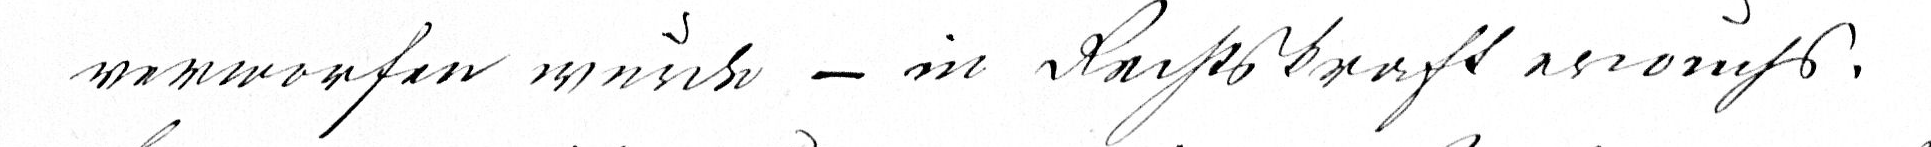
verworfen wurde — in Rechtskraft erwuchs.
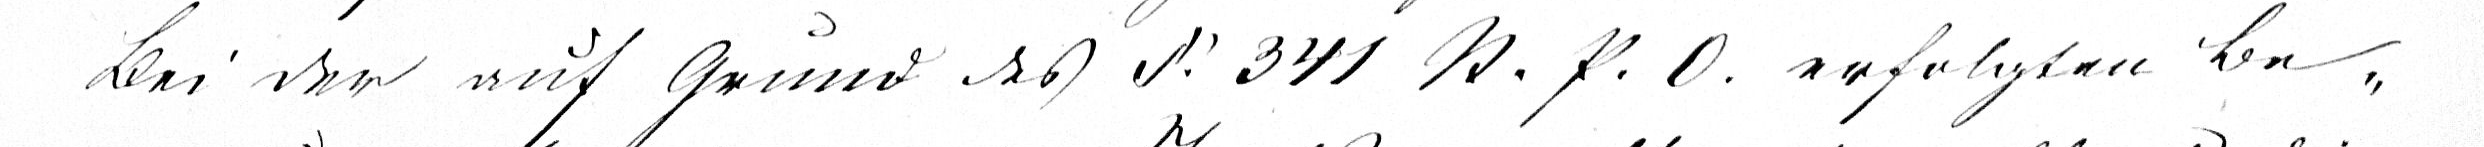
Bei der auf Grund des §. 341 St. P. O. erfolgten Be¬
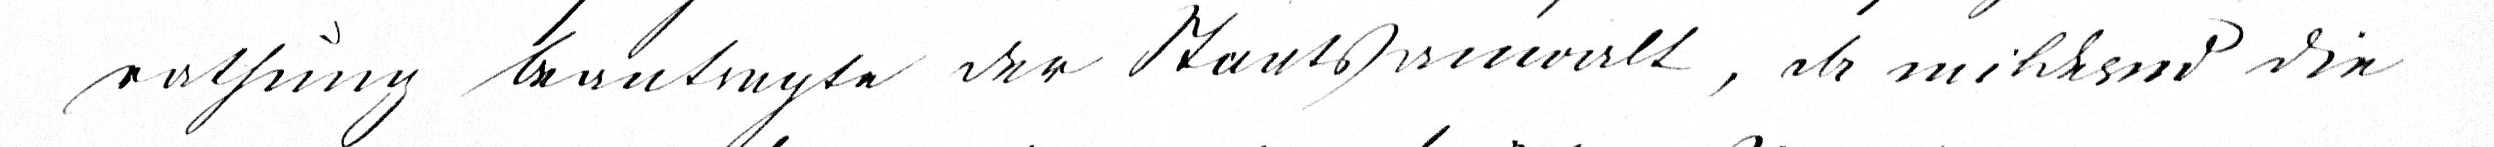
rathung beantragte der Staatsanwalt, da mildernd die
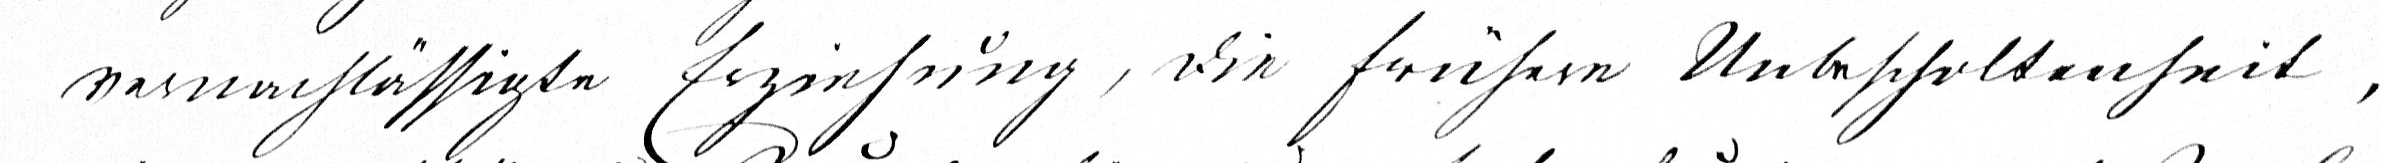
vernachlässigte Erziehung, die frühern Unbescholtenheit,
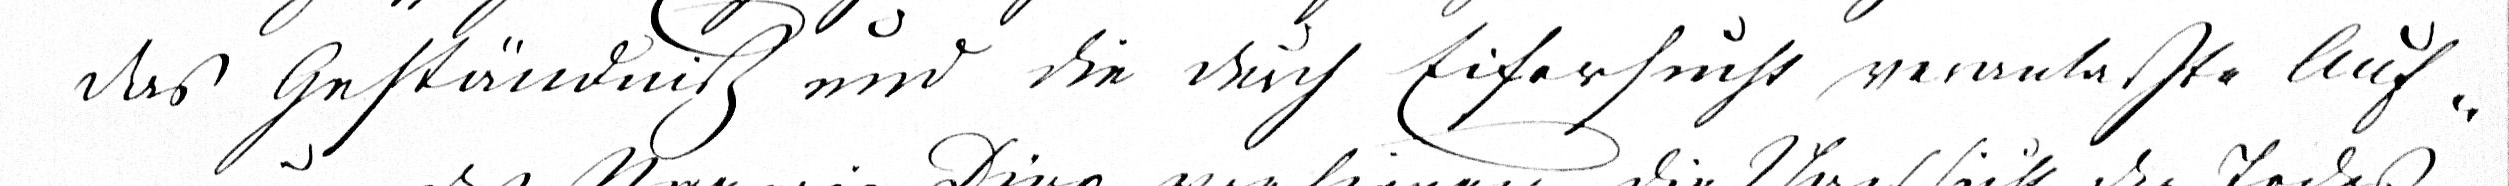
das Geständniß und die durch Eifersucht veranlaßte Auf¬
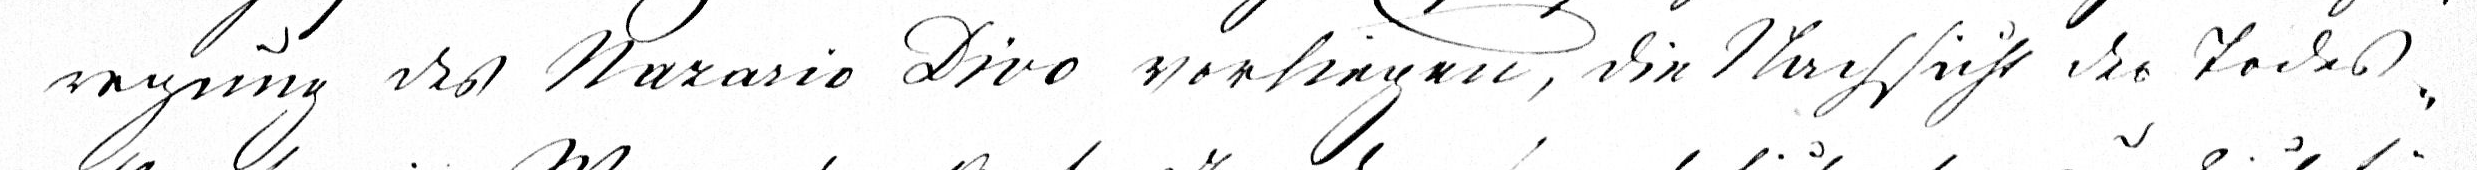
regung des Nazario Divo vorliegen, die Nachsicht der Todes¬
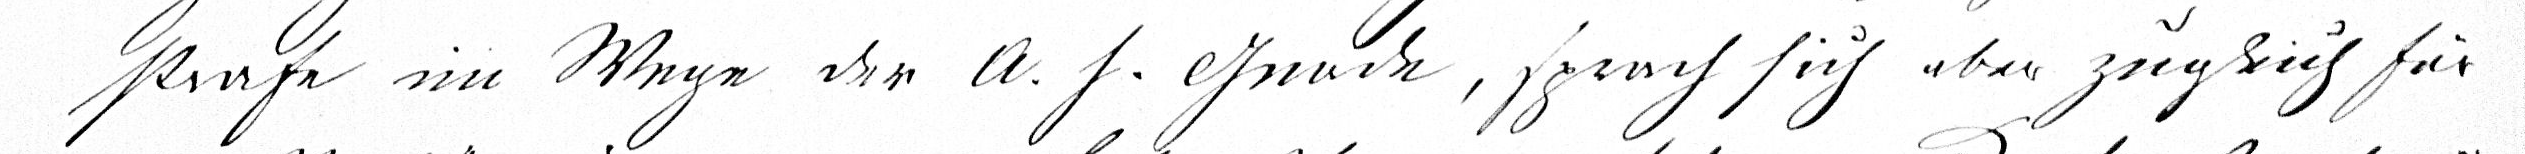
strafe im Wege der A. H. Gnade, sprach sich aber zugleich für
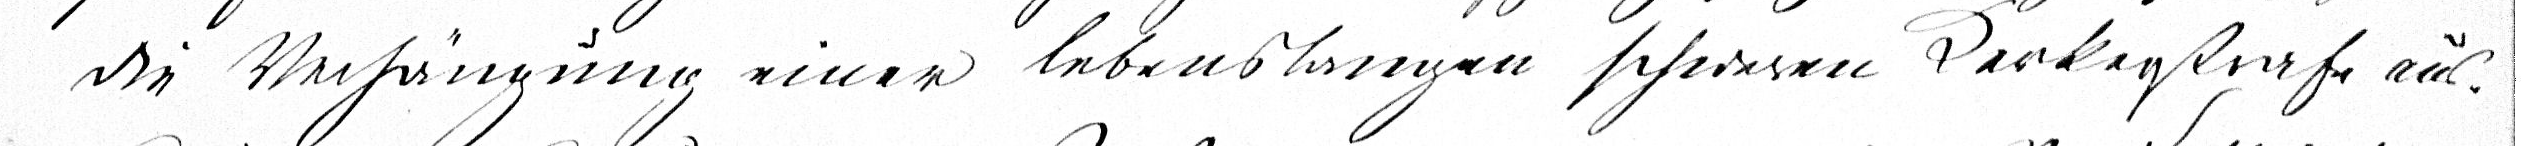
die Verhängung einer lebenslangen schweren Kerkerstrafe aus.
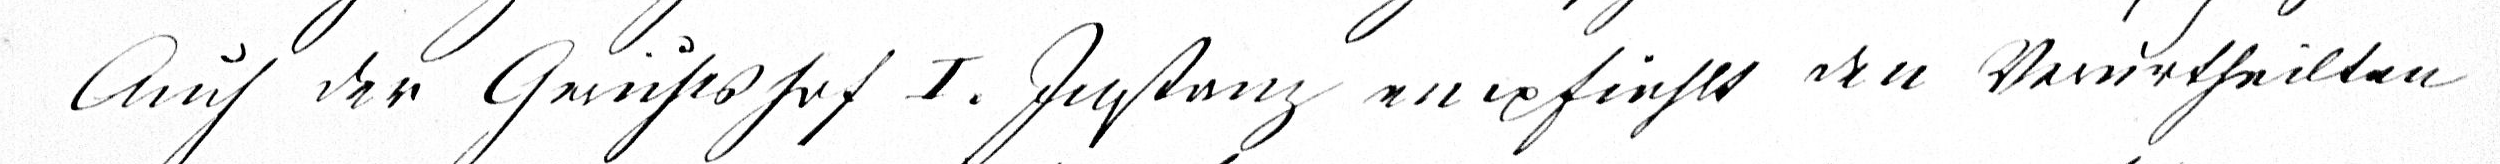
Auch der Gerichtshof I. Instanz empfiehlt den Verurtheilten
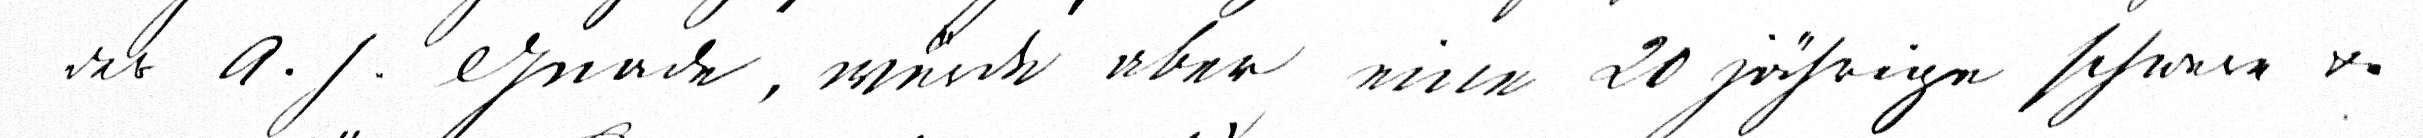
der A. H. Gnade, wurde aber eine 20 jährige schwere &
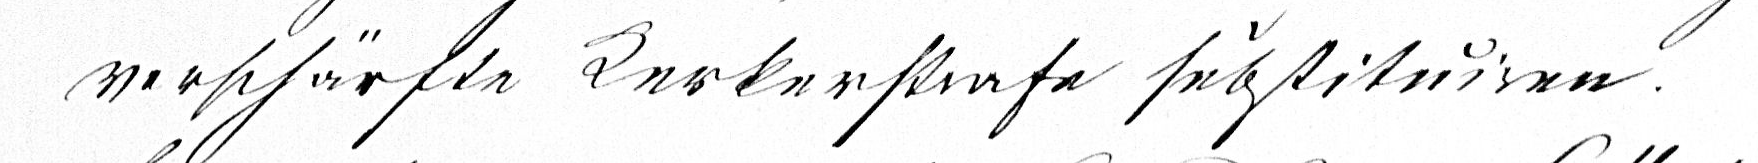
verschärfte Kerkerstrafe substituiren.
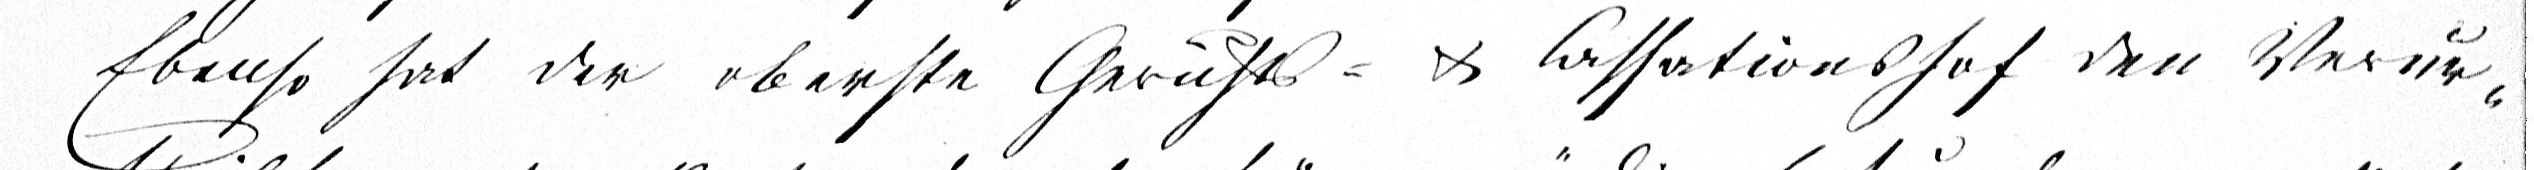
Ebenso hat der oberste Gerichts- & Cassationshof den Verur¬
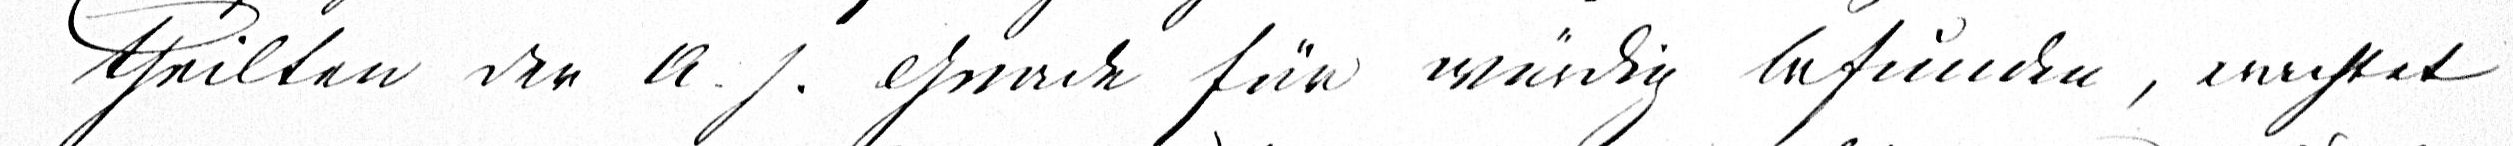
theilten der A. H. Gnade für würdig befunden, erachtet
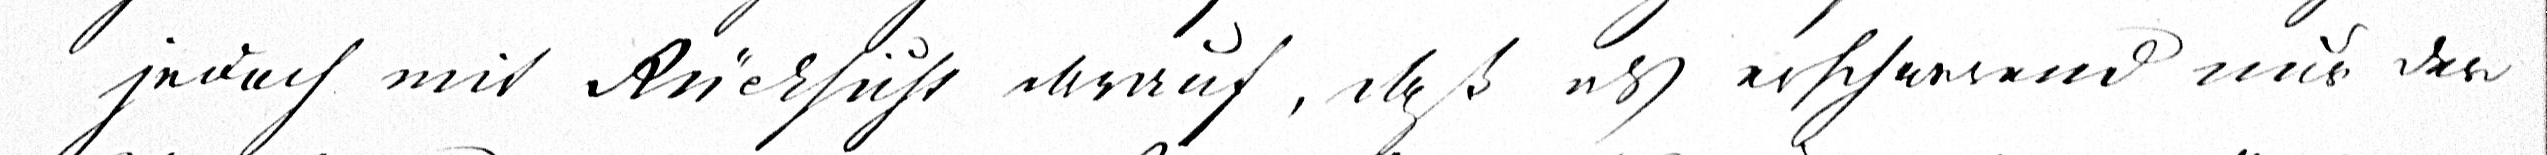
jedoch mit Rücksicht darauf, daß als erschwerend nur der
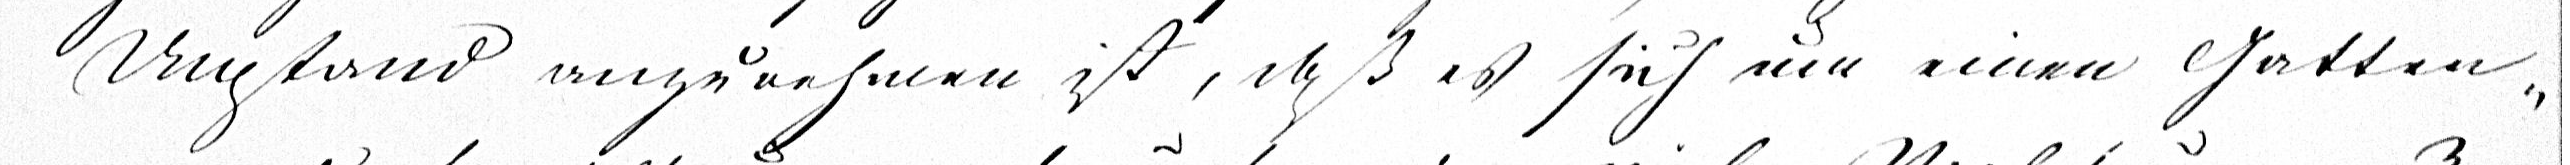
Unstand anzunehmen ist, daß es sich um einen Gatten¬
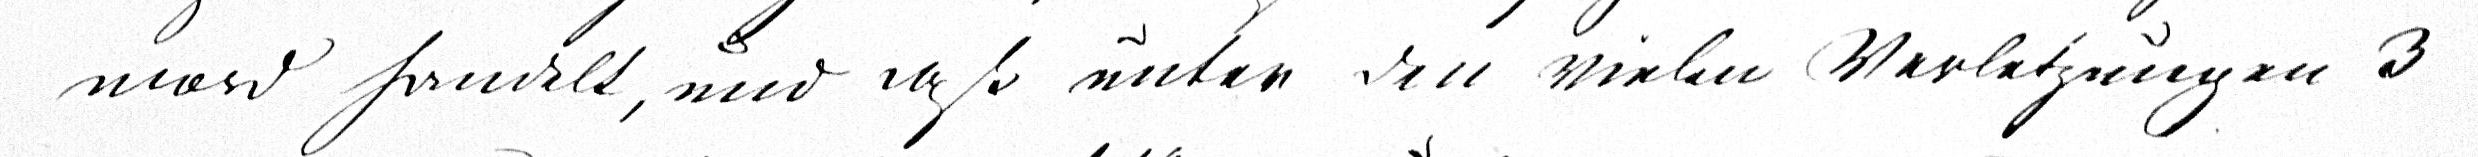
mord handelt, und daß unter den vielen Verletzungen 3
